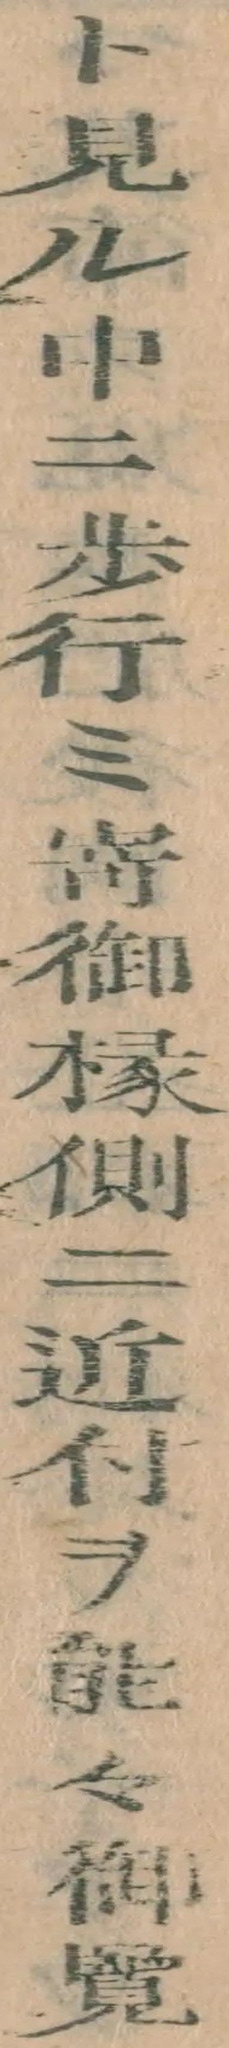ト見ル中ニ歩行ミ寄御椽側ニ近付ヲ能々御覧
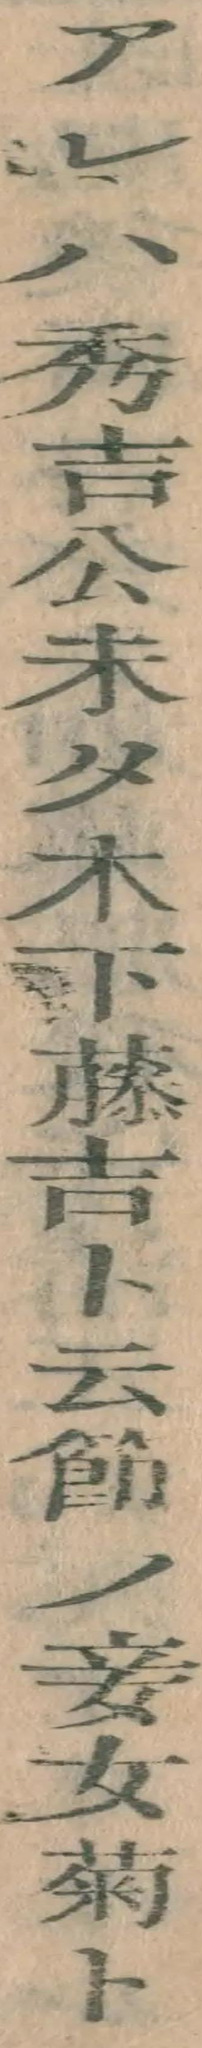アレハ秀吉公未タ木下藤吉ト云節ノ妾女菊ト
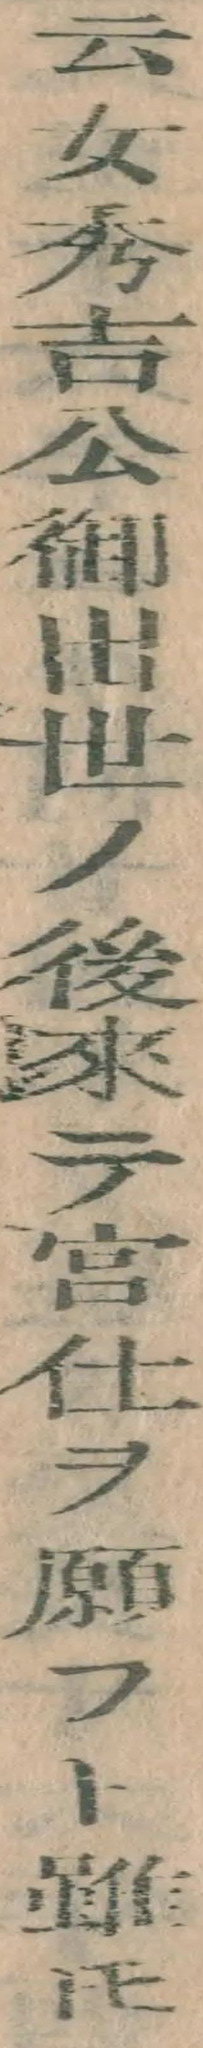云女秀吉公御出世ノ後来テ宮仕ヲ願フト雖トモ
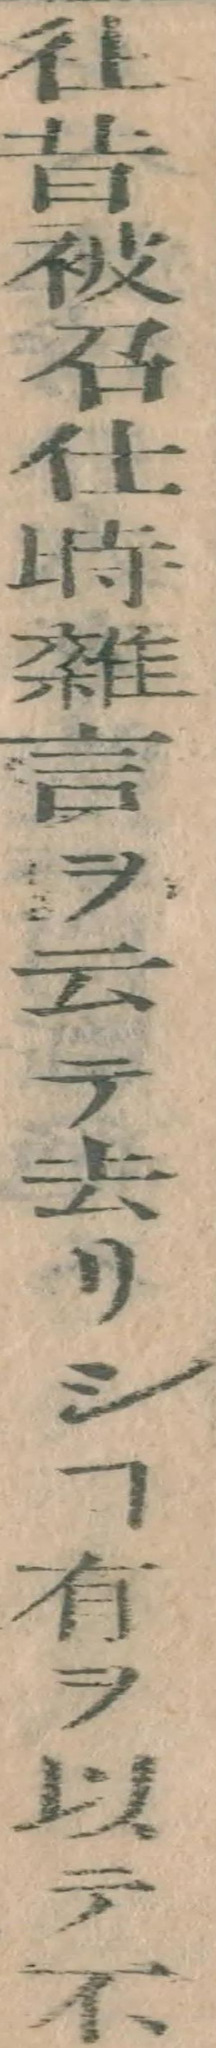往昔被召仕時雑言ヲ云テ去リシヿ有ヲ以テ不
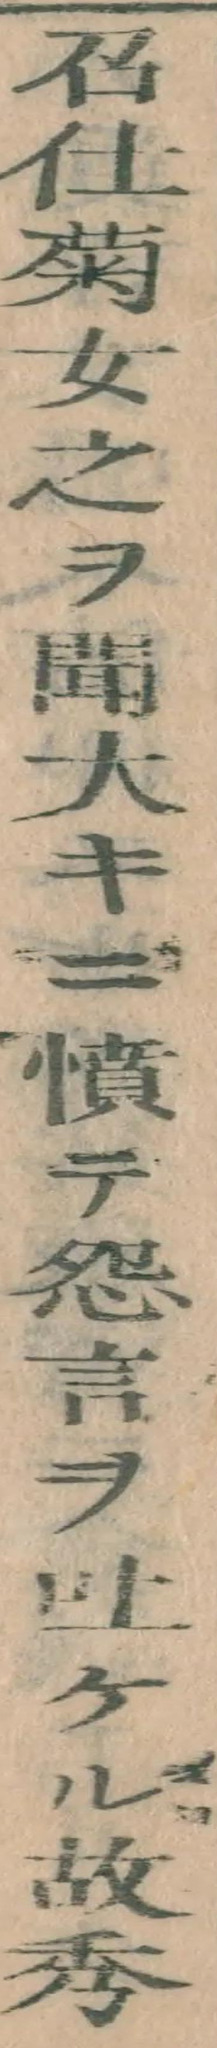召仕菊女之ヲ聞大キニ憤テ怨言ヲ吐ケル故秀
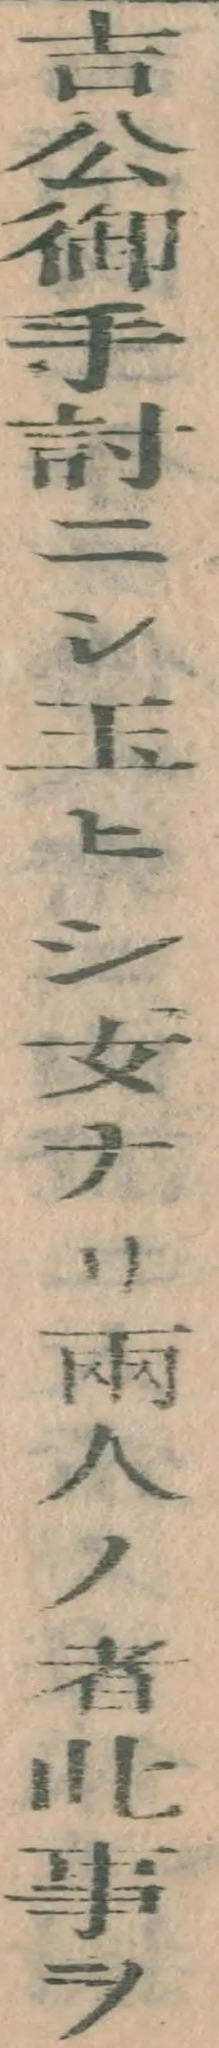吉公御手討ニシ玉ヒシ女ナリ両人ノ者此事ヲ
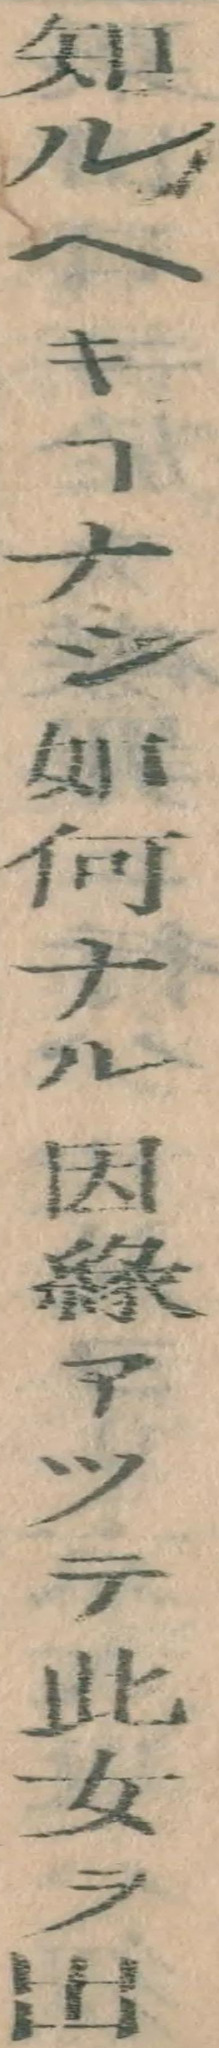知ルヘキヿナシ如何ナル因縁アツテ此女ヲ出
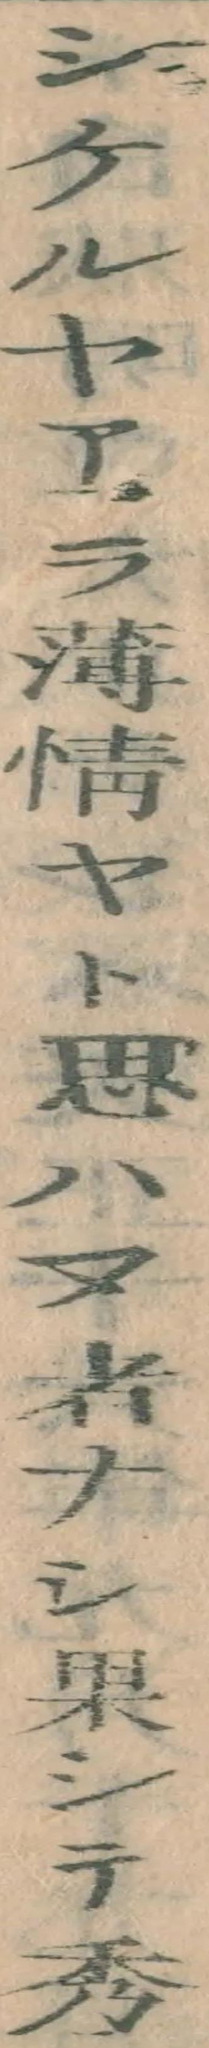シケルヤアラ薄情ヤト思ハヌ者ナシ果シテ秀
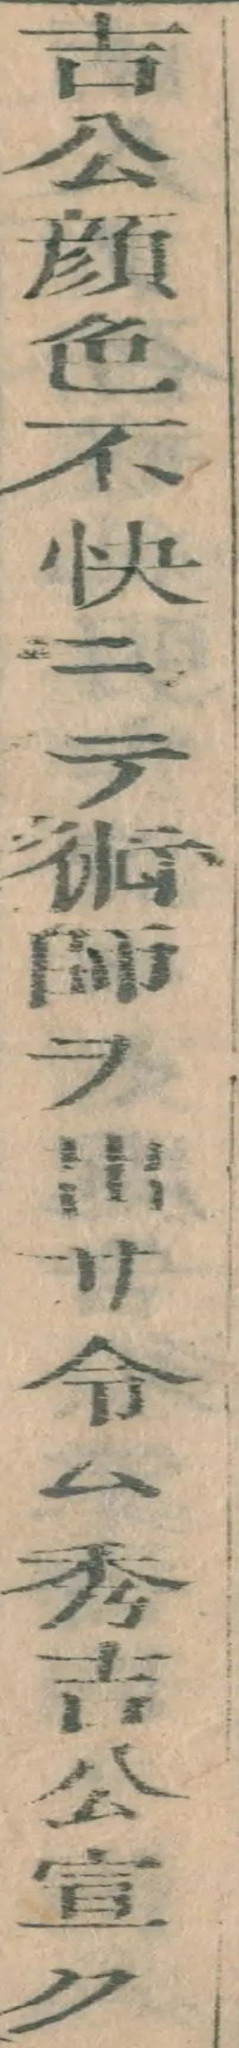吉公顔色不快ニテ術師ヲ出サ令ム秀吉公宣ク
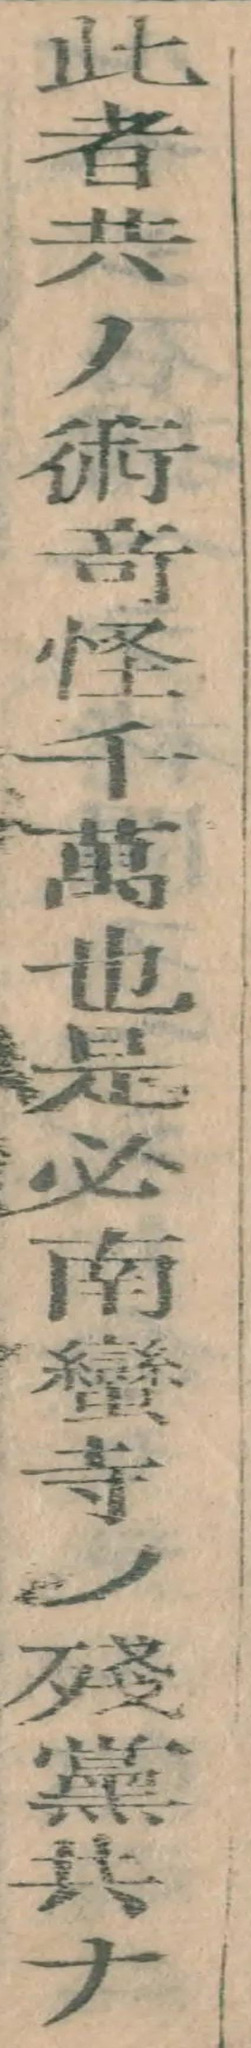此者共ノ術奇怪千万也是必南蛮寺ノ残党共ナ

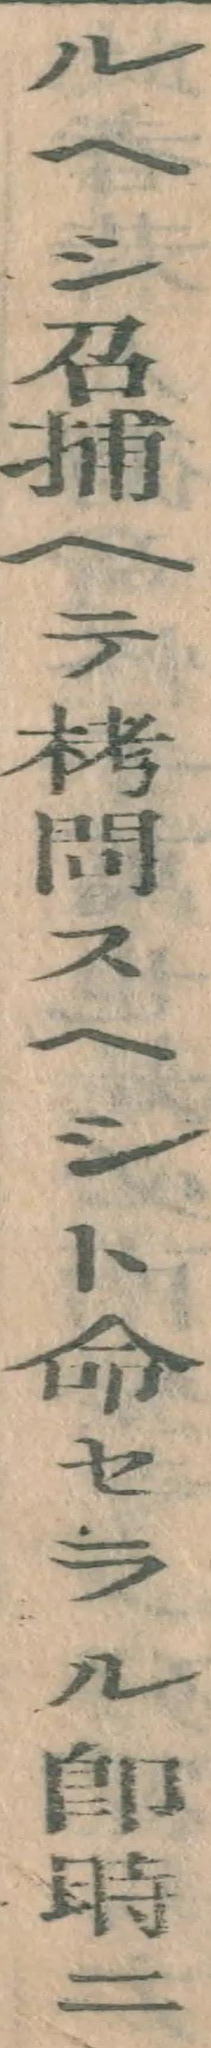ルヘシ召捕ヘテ栲問スヘシト命セラル即時ニ
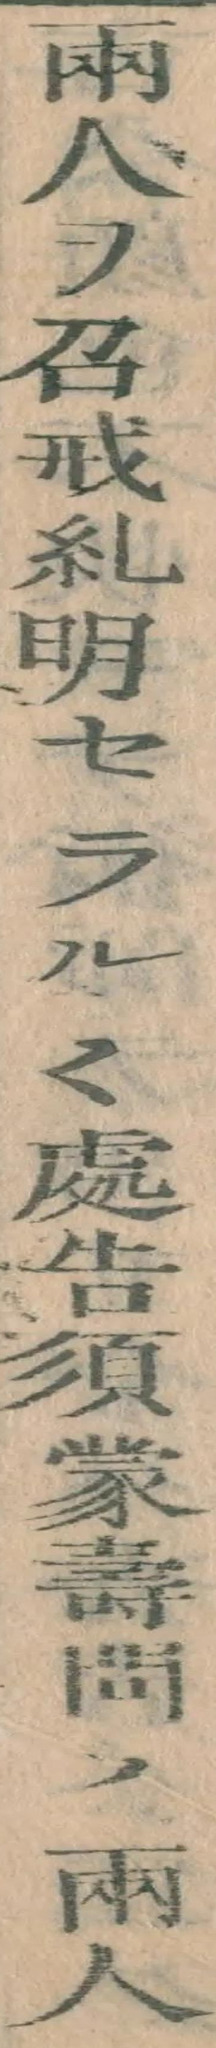両人ヲ召戒糺明セラル〱処告須蒙寿問ノ両人
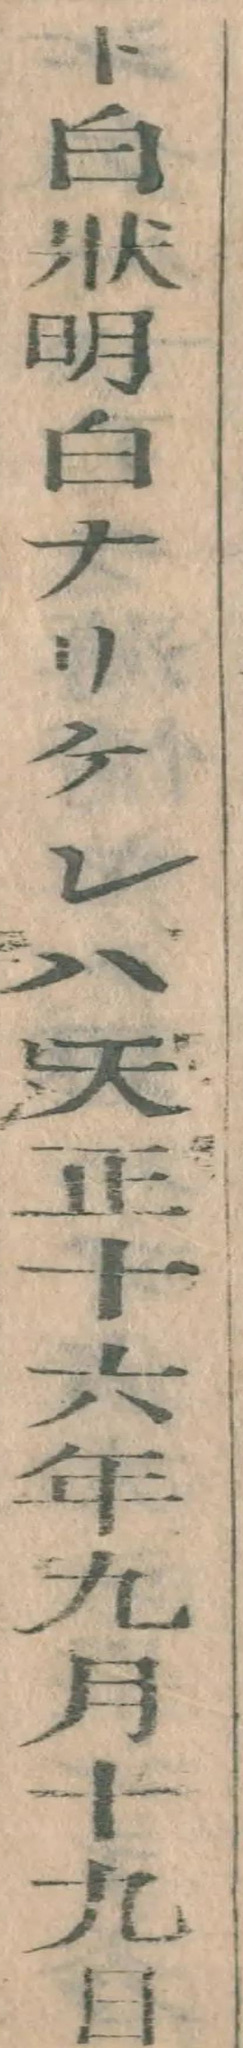ト白状明白ナリケレハ天正十六年九月十九日
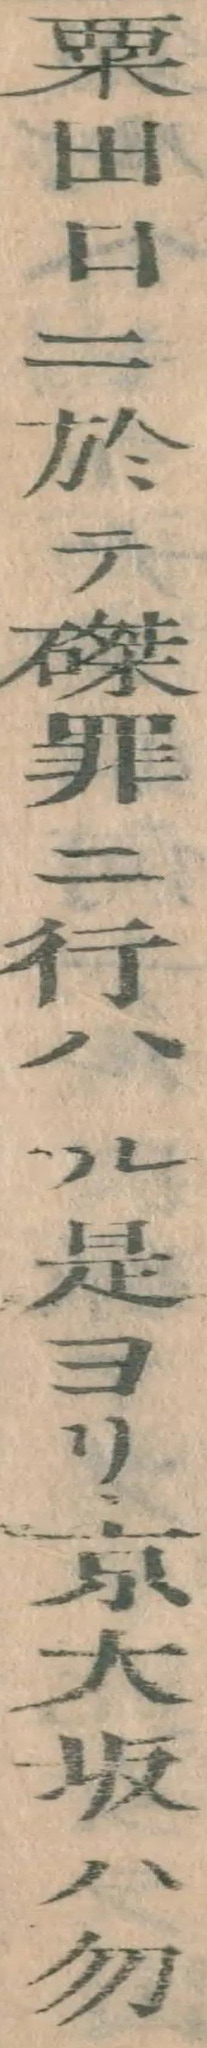粟田口ニ於テ磔罪ニ行ハル是ヨリ京大坂ハ勿
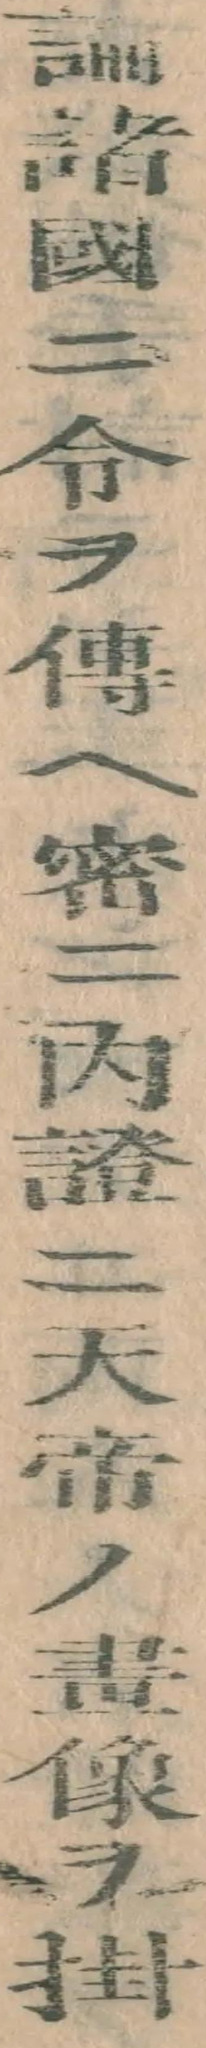論諸国二令ヲ伝ヘ密ニ内証ニ天帝ノ画像ヲ掛
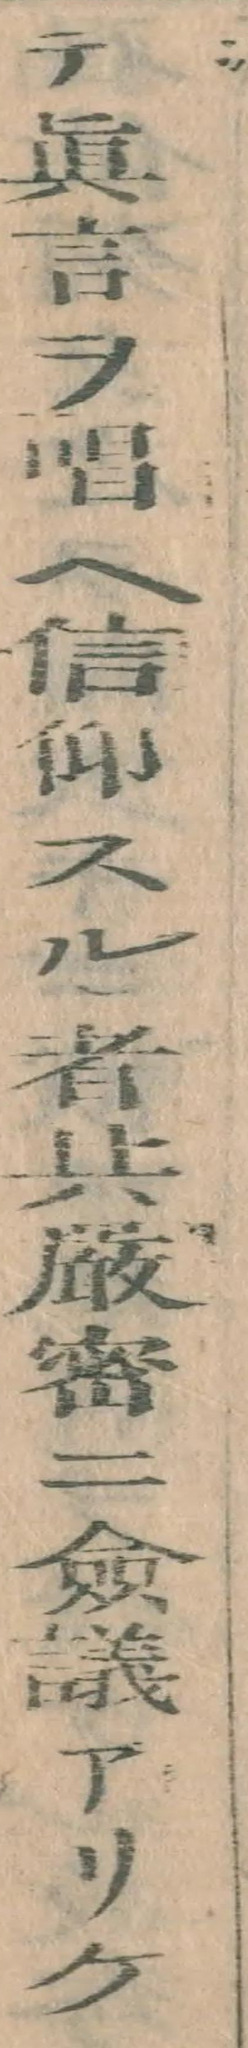テ真言ヲ唱ヘ信仰スル者共厳密ニ僉議アリケ
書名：南蛮寺興廃記
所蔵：国立国会図書館 National Diet Library, JAPAN
